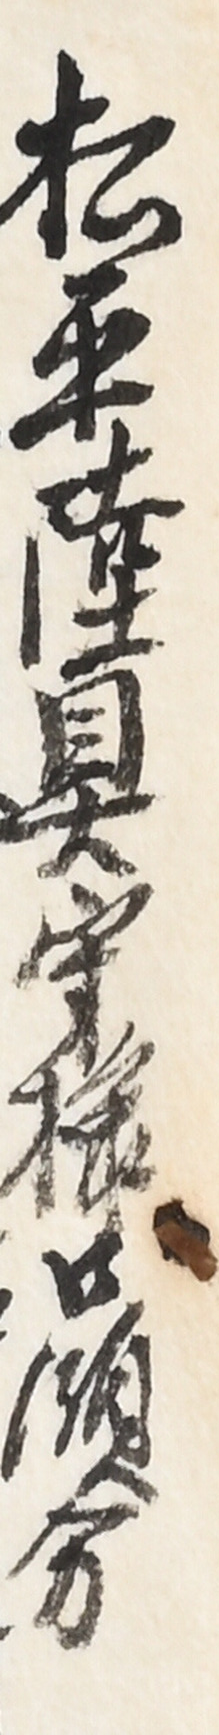松本陸奥守様御領分
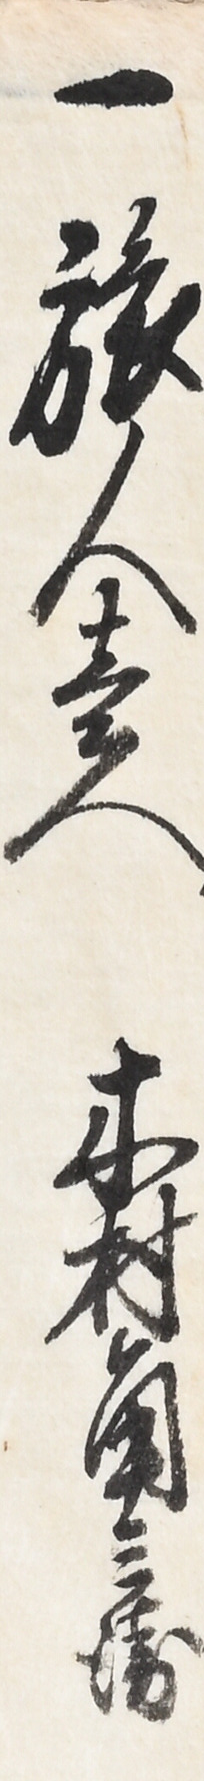一旅人壱人木村角兵衛
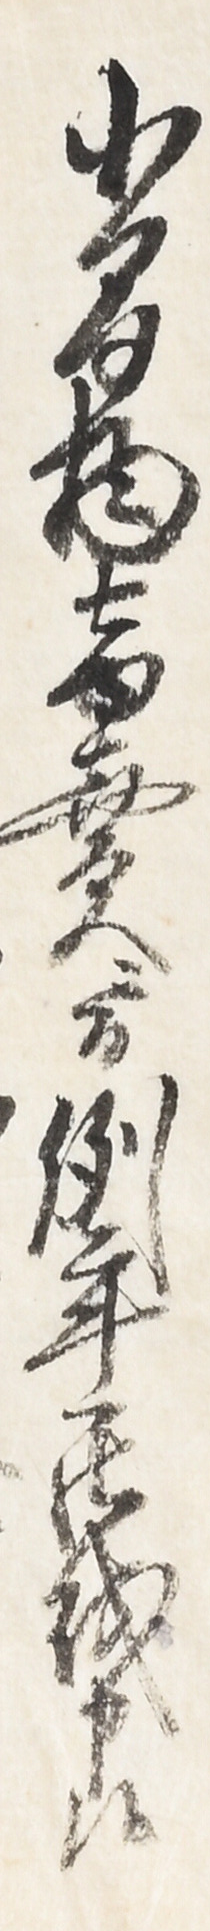小間物商売ニ而例年罷越申候
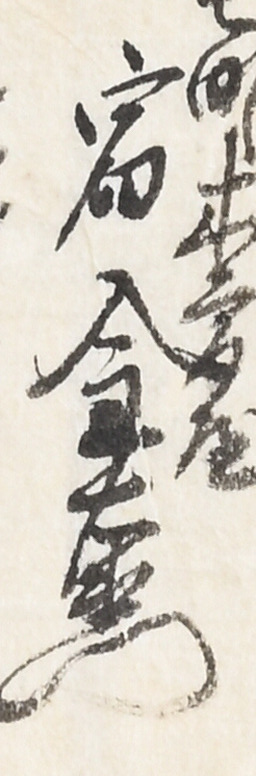宿金右衛門
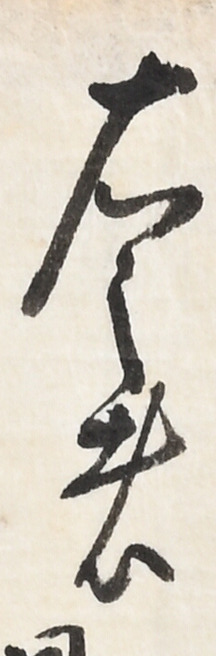右之者
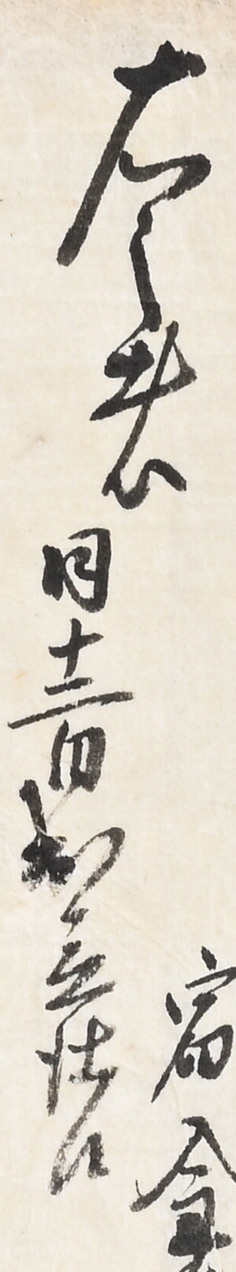右之者同十二日出立仕候
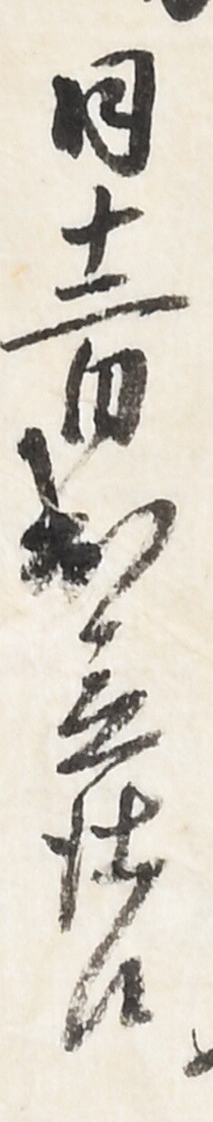同十二日出立仕候
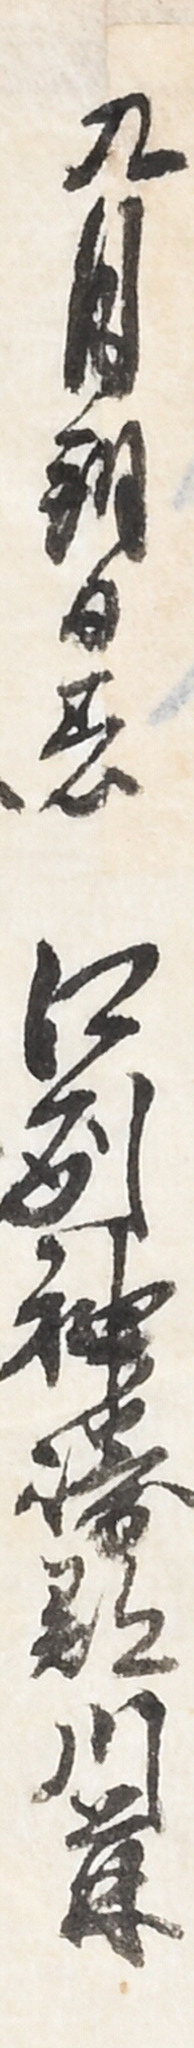九月朔日着江州神崎郡川並
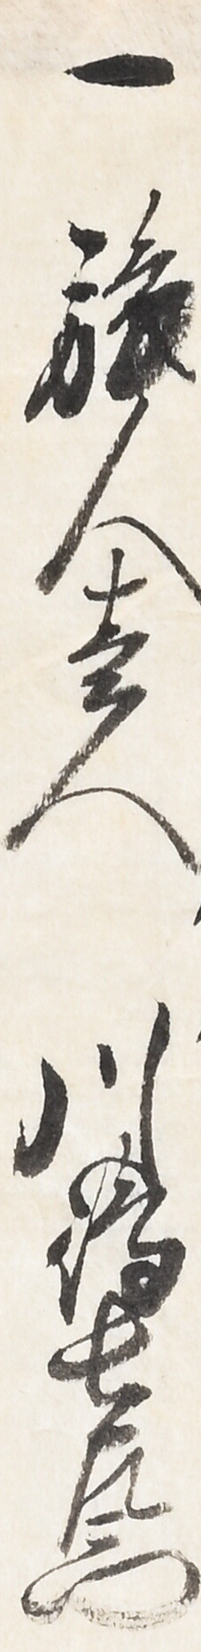一旅人壱人川嶋七左衛門
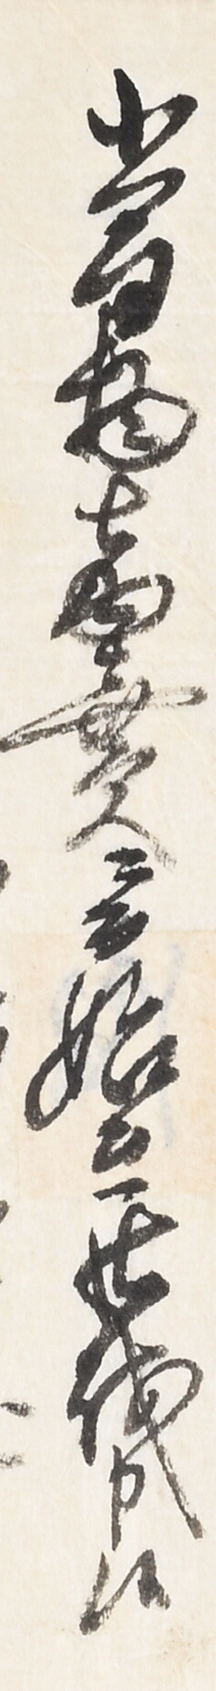小間物商売ニ而始而罷越申候
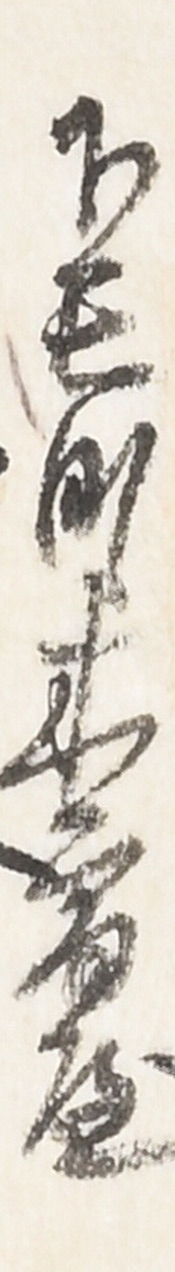下モ町木曽屋
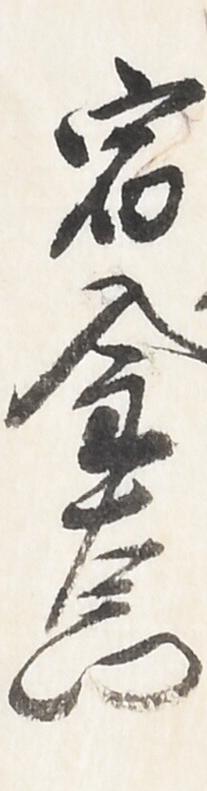宿金右衛門
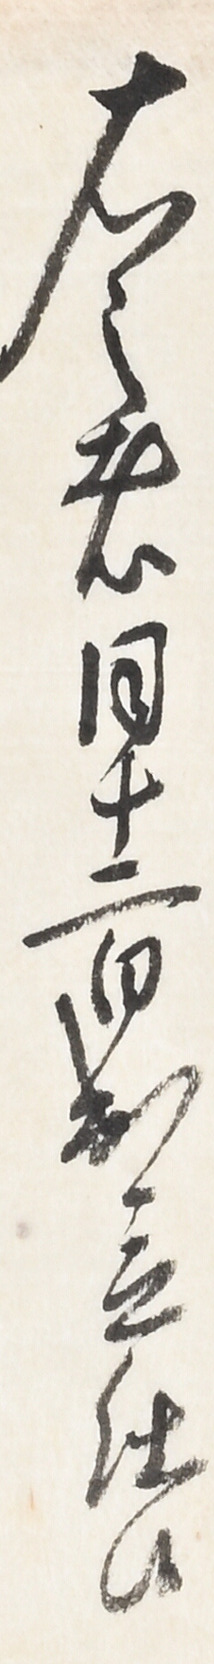右之者同十二日出立仕候
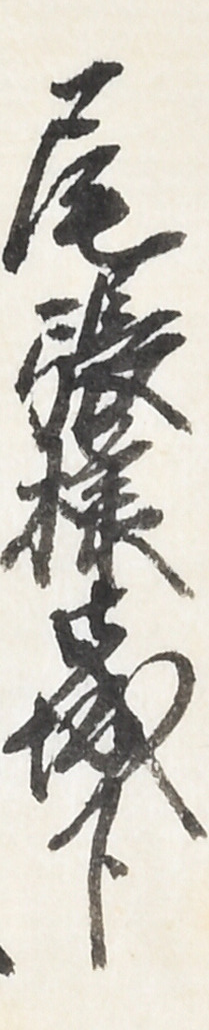尾張様御城下
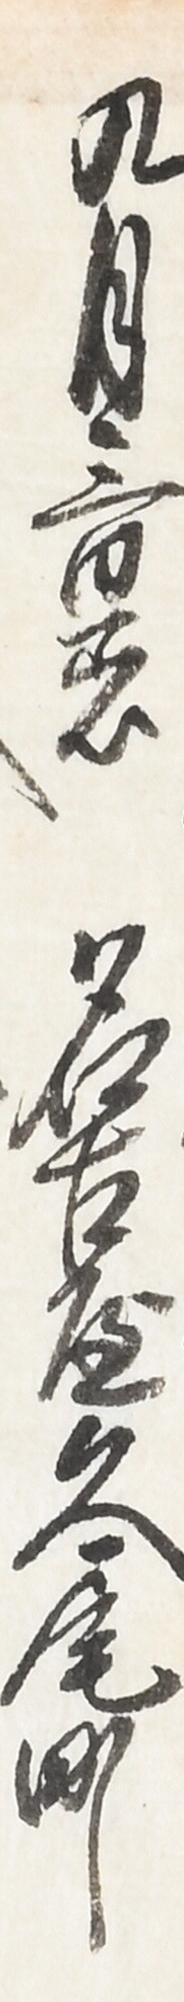九月三日着名古屋久尾町
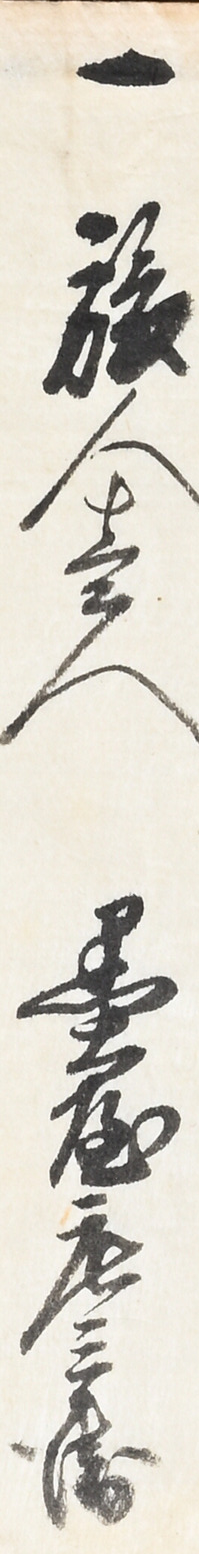一旅人壱人墨屋庄兵衛
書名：旅人泊控帳
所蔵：伊那市立高遠町図書館・合同会社AMANE
